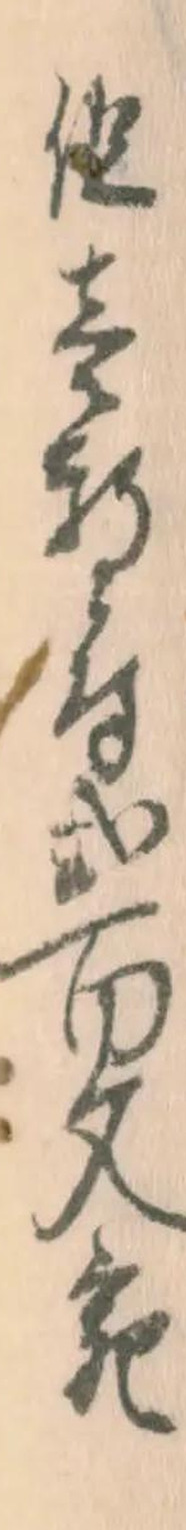但壱軒ニ付銭三百文宛
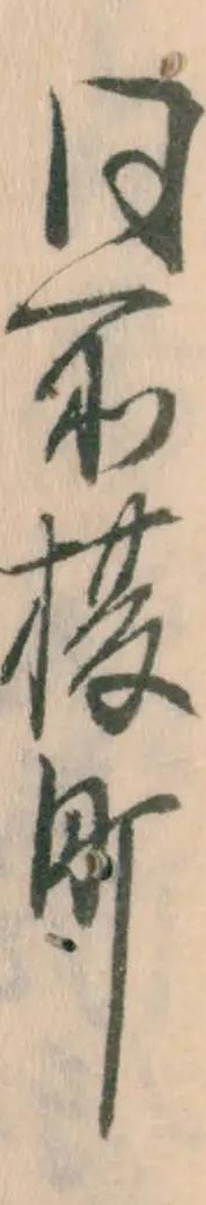同所榎町
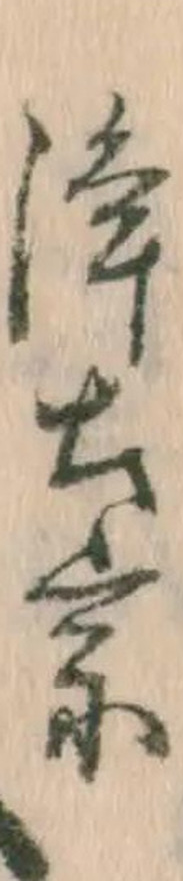浄土宗
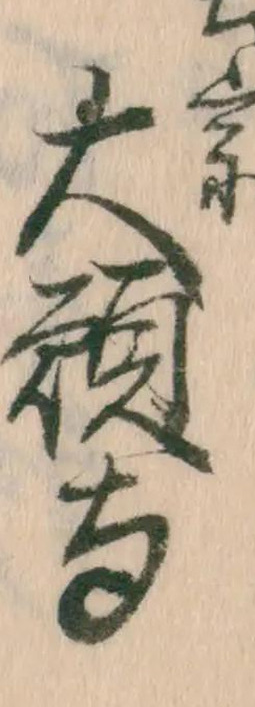大願寺
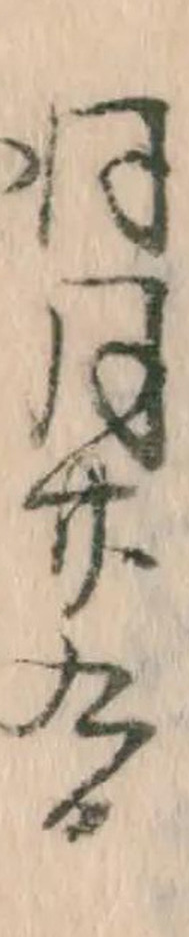同月廿九日
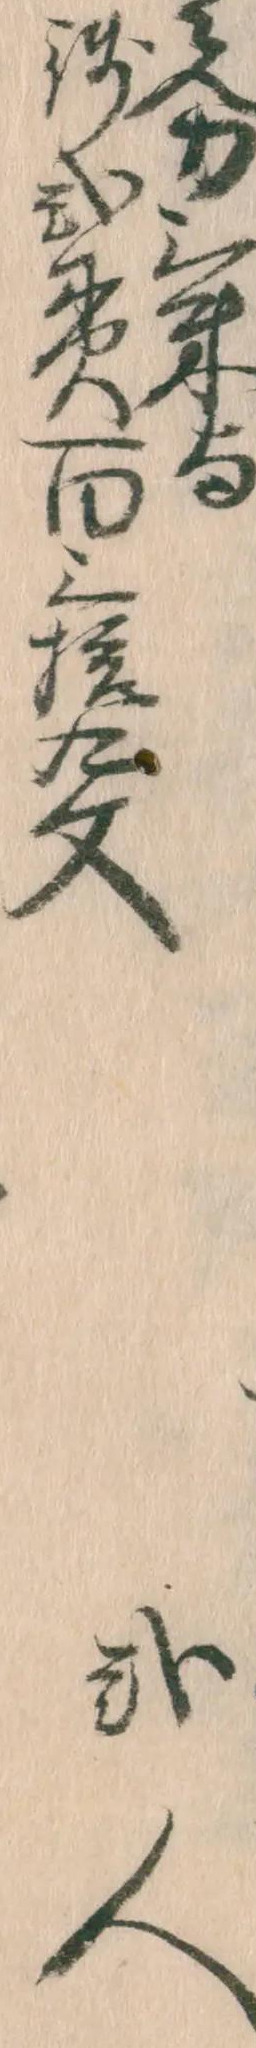銭弐貫百三拾九文弐人
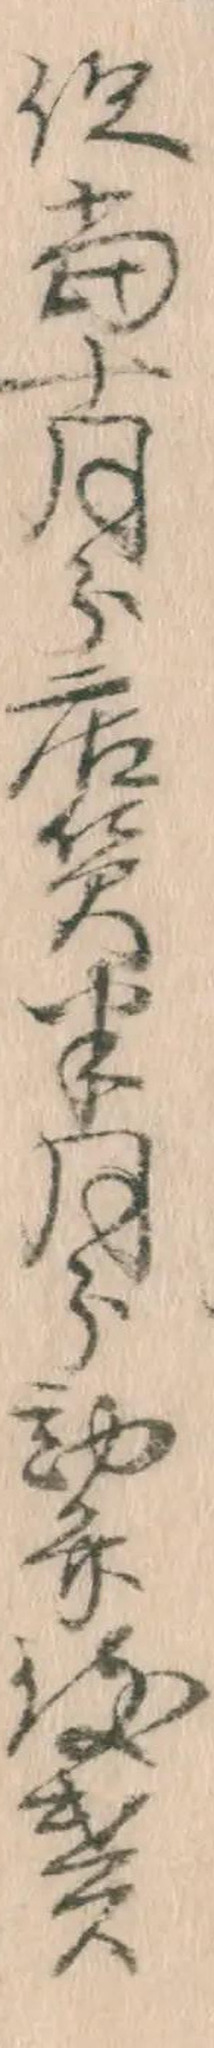但当十月分店賃半月分勘弁遣ス
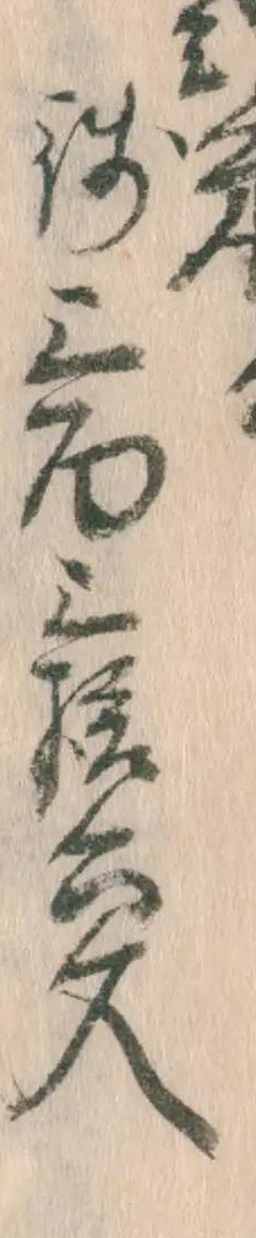銭三百三拾六文
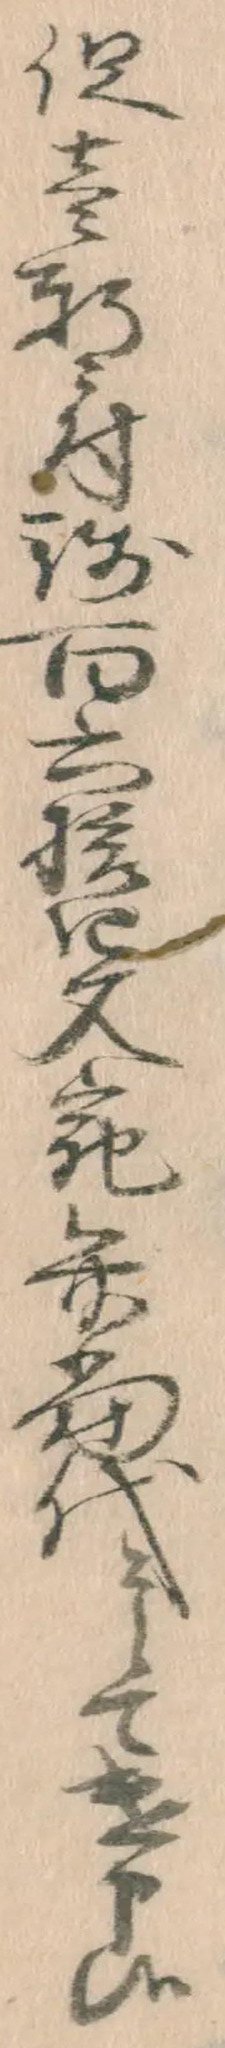但壱軒ニ付銭百六拾四文宛弁当代として遣申候

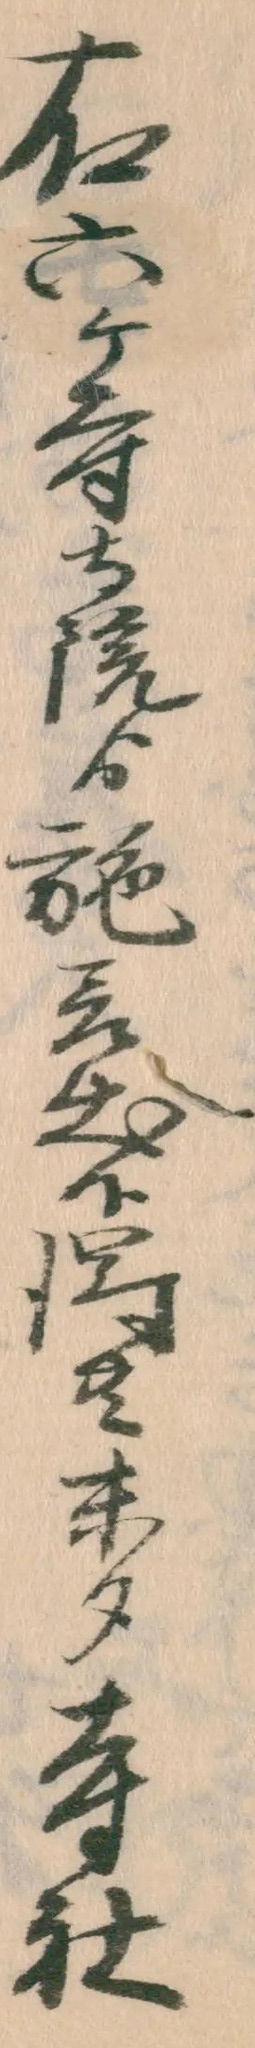右六ケ寺寺院ゟ施差出候得共未タ寺社
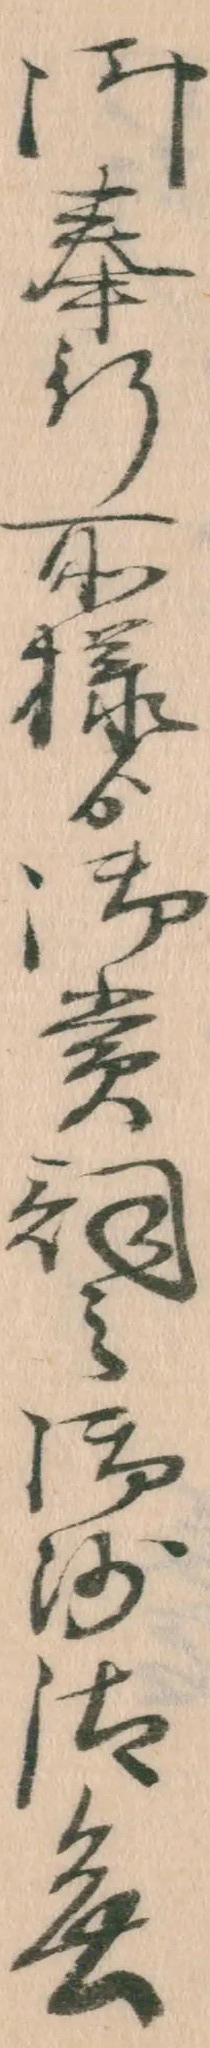御奉行所様ゟ御賞詞之御沙汰無
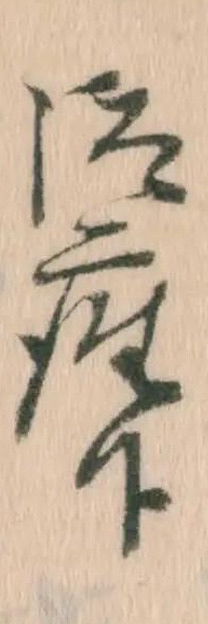御座候
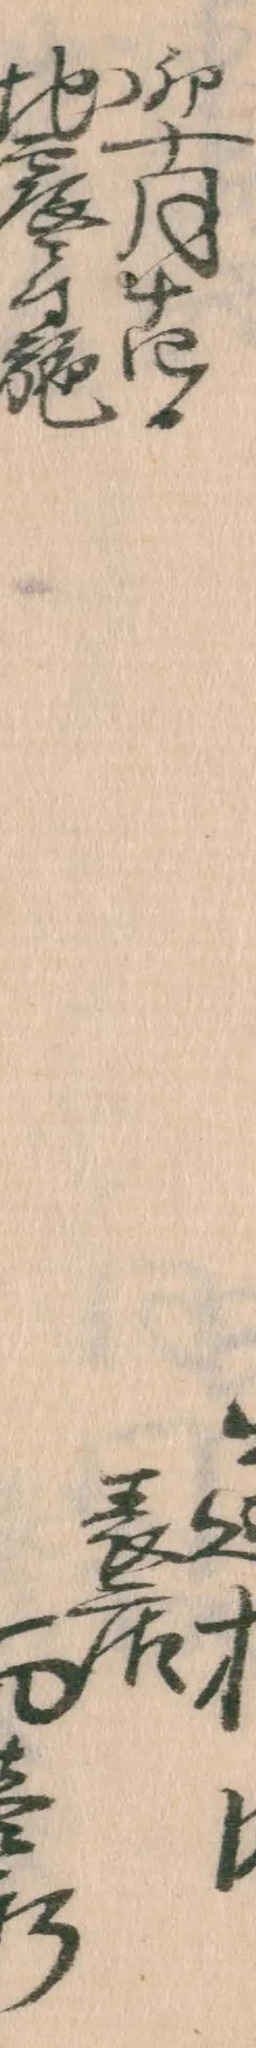地震ニ付施百壱軒
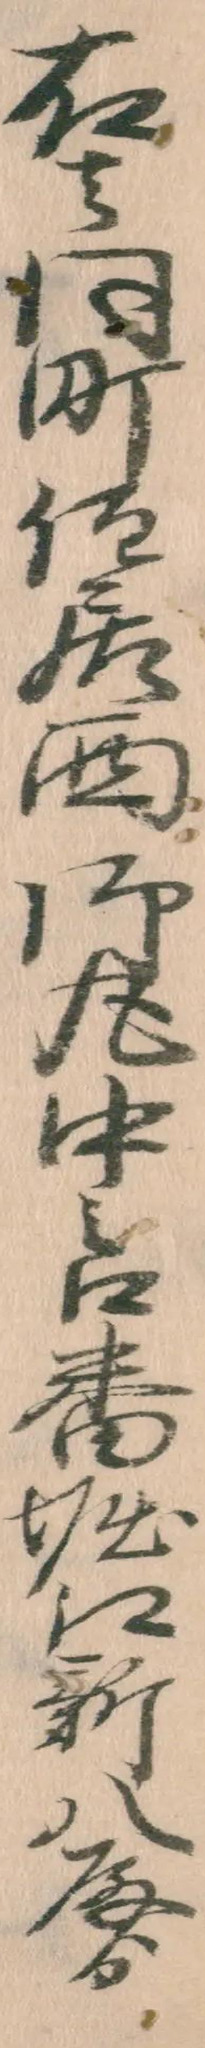右は同町住居西御丸中之口番堀江新八殿ゟ
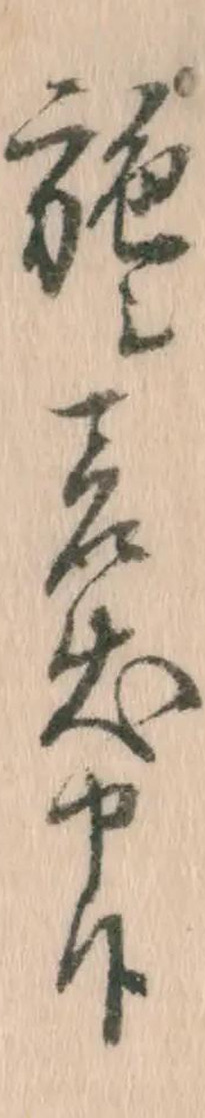施シ差出申候
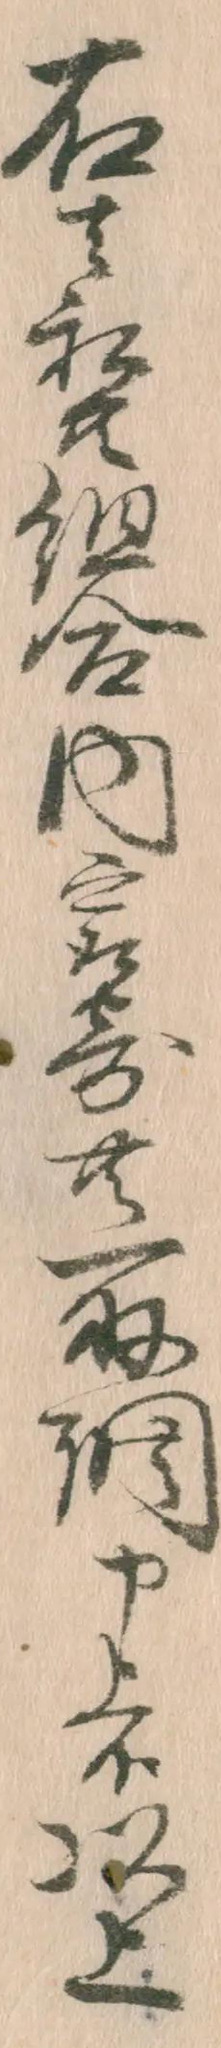右は私共組合内最寄共取調申上候以上
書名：武家方并寺院等ニテ施差出候一件
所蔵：国立国会図書館 National Diet Library, JAPAN
